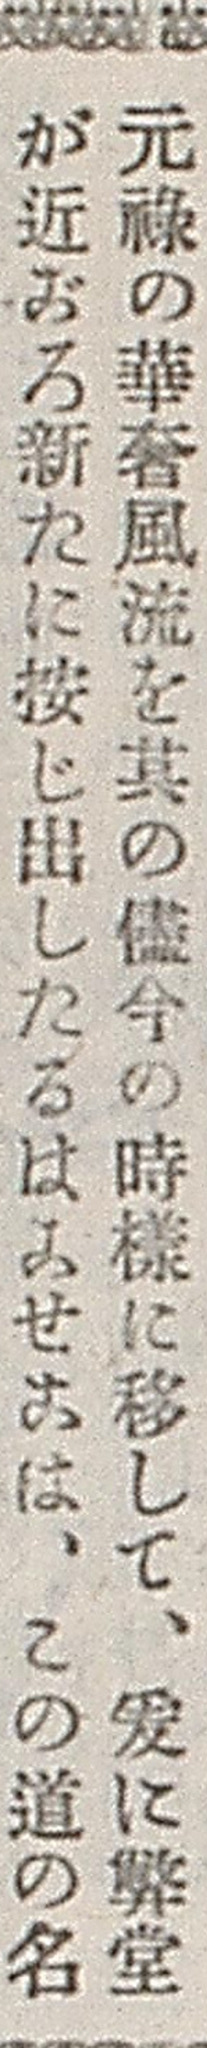元禄の華奢風流を其の儘今の時様に移して、爰に弊堂
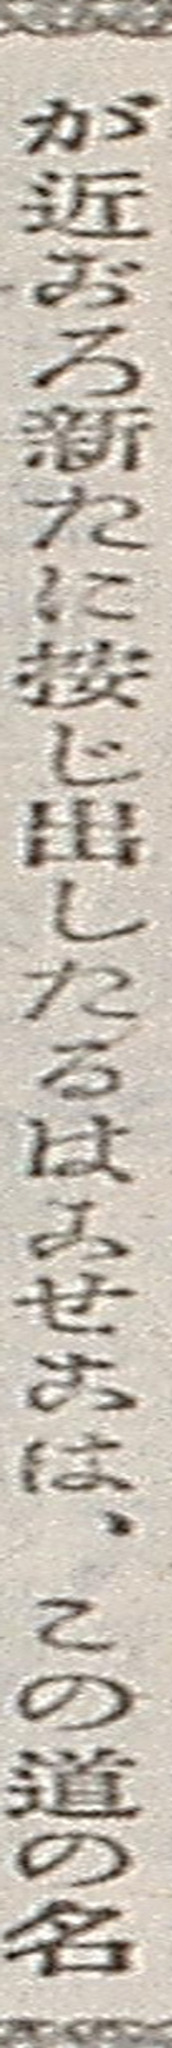が近ごろ新たに按じ出したるはこせこは、この道の名
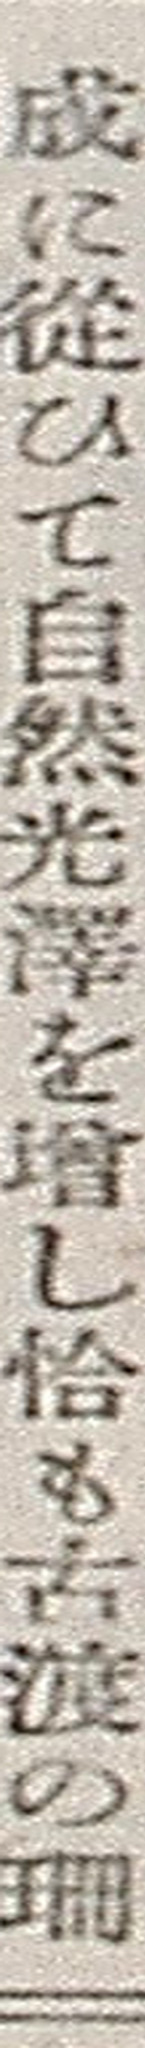成に従ひて自然光沢を増し恰も古渡の珊
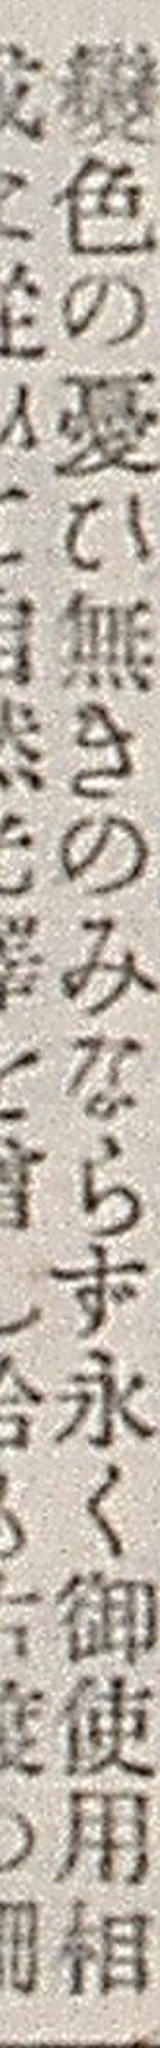変色の憂ひ無きのみならず永く御使用相
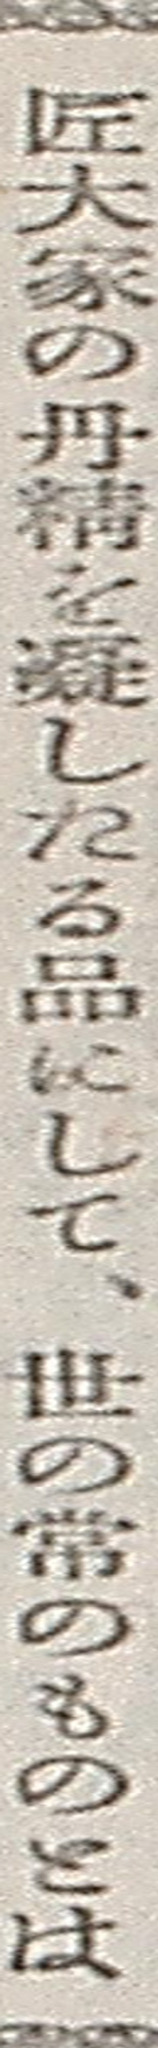匠大家の丹精を凝したる品にして、世の常のものとは
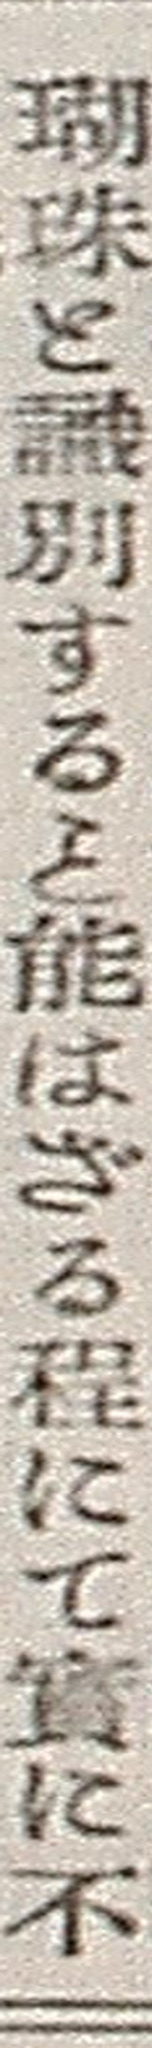瑚珠と識別すること能はざる程にて実に不
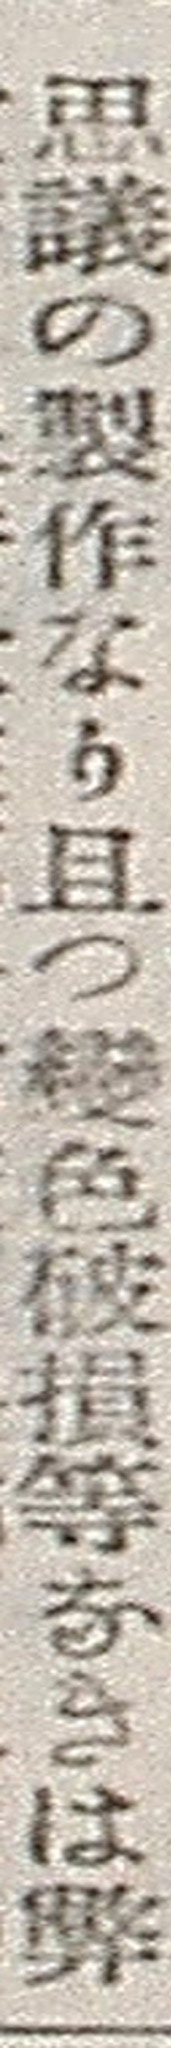思議の製作なり且つ変色破損等なきは弊
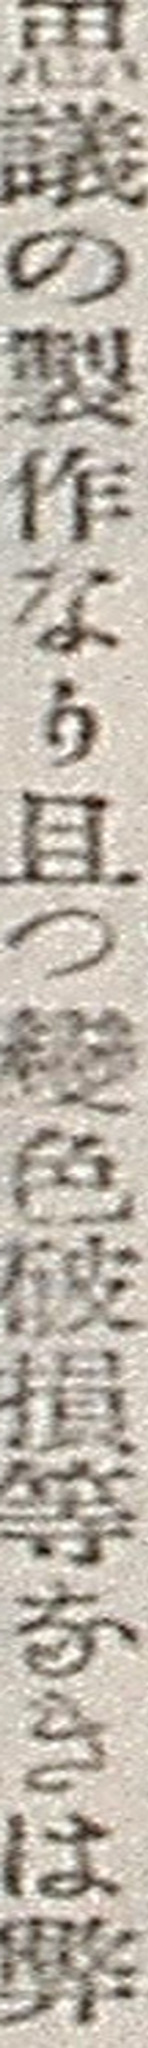思議の製作なり且つ変色破損等なきは弊
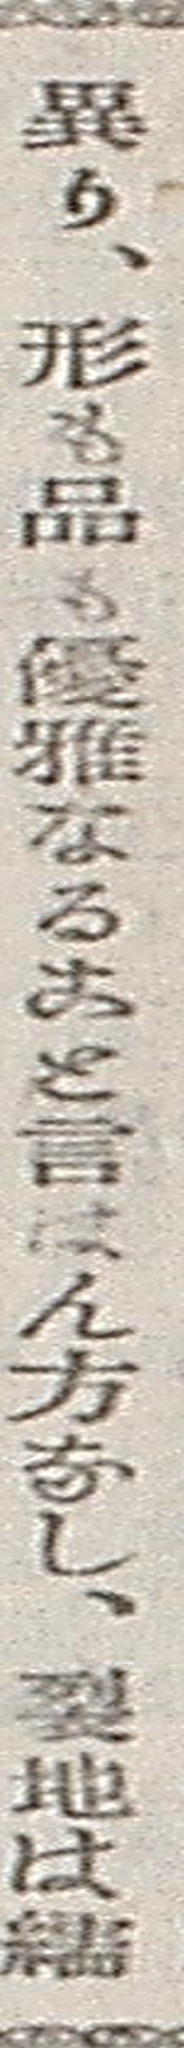異り、形も品も優雅なること言はん方なし、裂地は繻
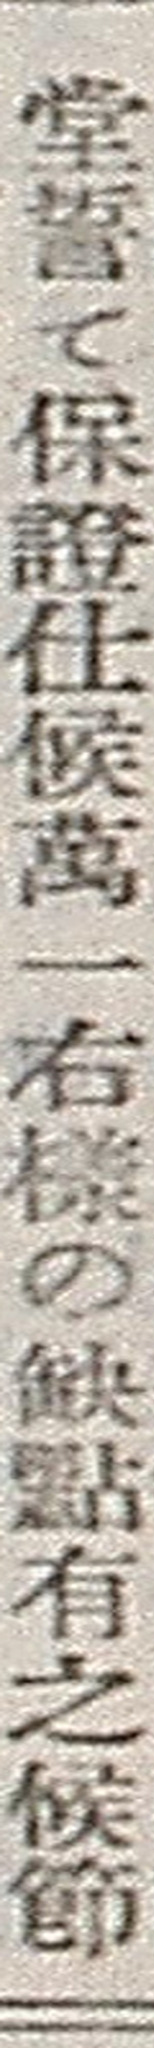堂誓て保証仕候万一右様の欠点有之候節
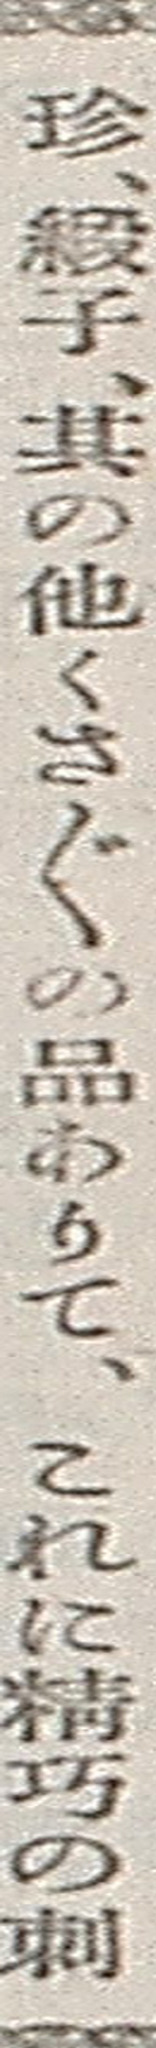珍、緞子、其の他くさ〴〵の品ありて、これに精巧の刺
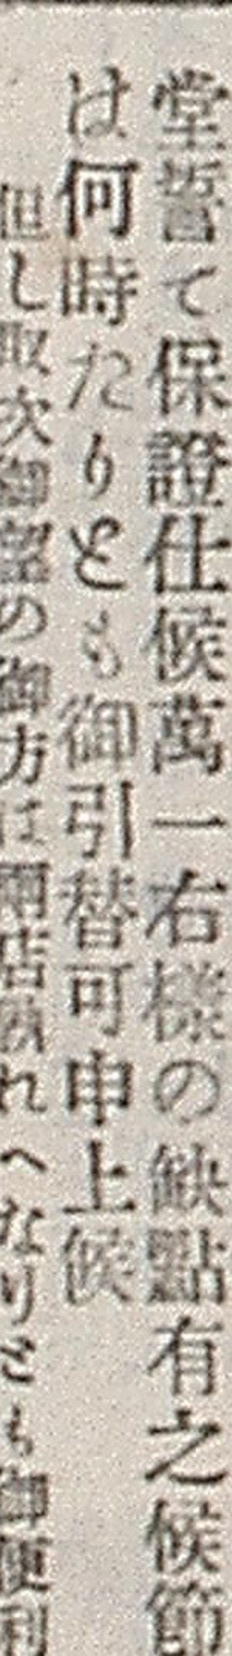は何時たりとも御引替可申上候
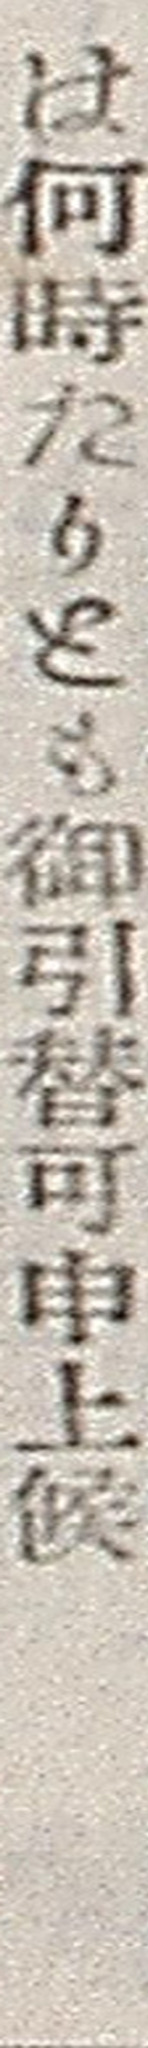は何時たりとも御引替可申上候
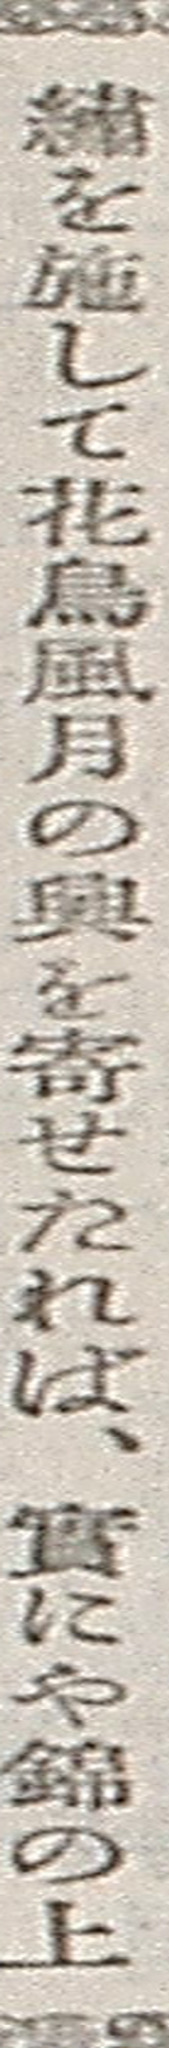繍を施して花鳥風月の興を寄せたれば、実にや錦の上
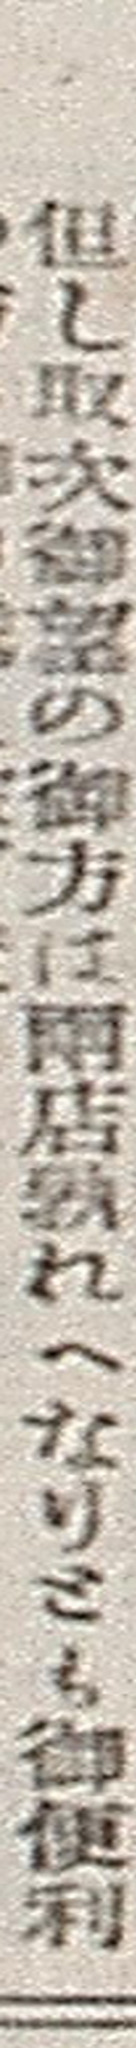但し取次御望の御方は両店孰れへなりとも御便利
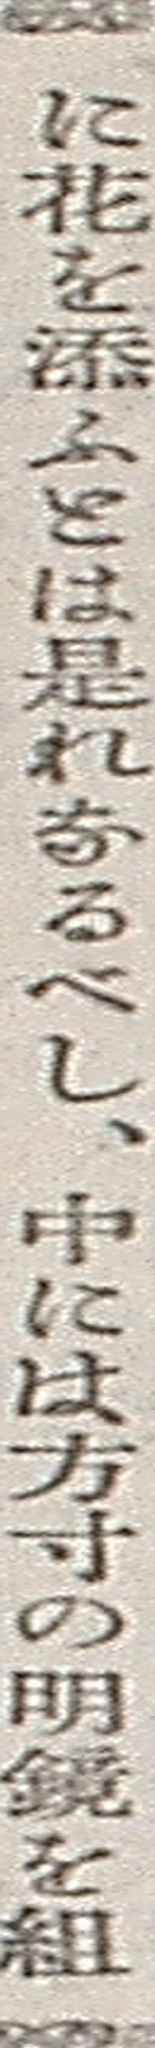に花を添ふとは是れなるべし、中には方寸の明鏡を組
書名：風俗畫報臨時増刊第百二十四號　洪水地震被害録（上）
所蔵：東京大学地震研究所図書室 Earthquake Research Institute Library, The University of Tokyo, JAPAN
